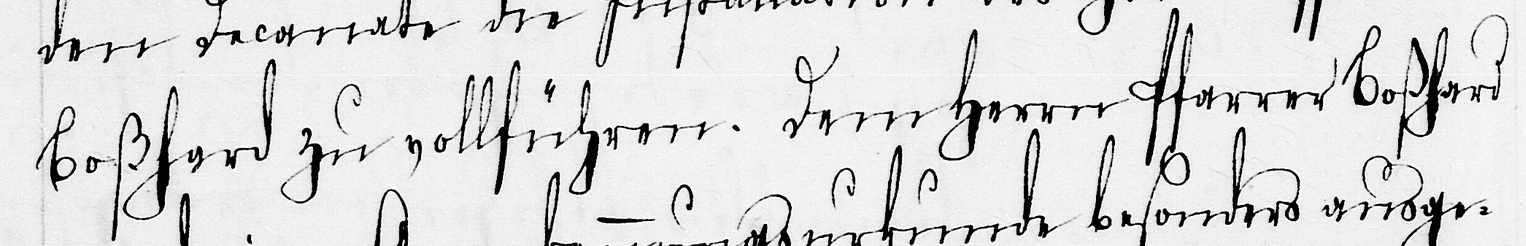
Boßhard zu vollführen. Dem Herrn Pfarrer Boßhard
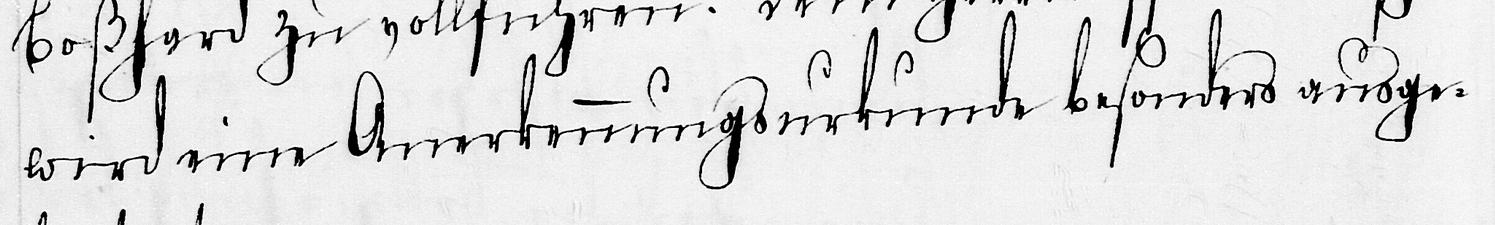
wird eine Anerkennungskunde besonders ausge¬
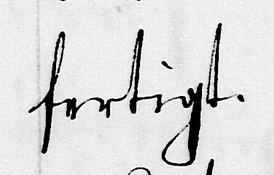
fertigt.
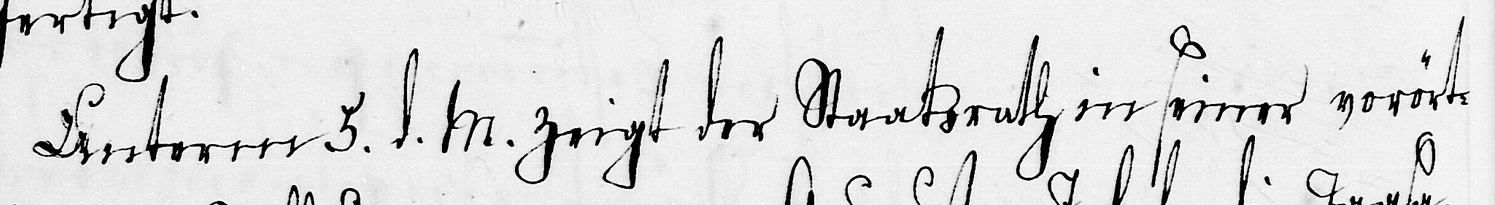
Unterm 5. d. M. zeigt der Staatsrath in seiner vorört¬
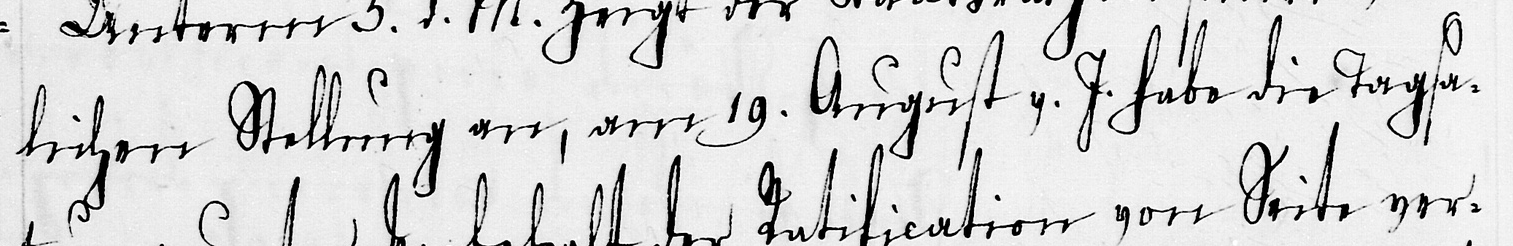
lichen Stellung an, am 19. August v. J. habe die Tagsa¬
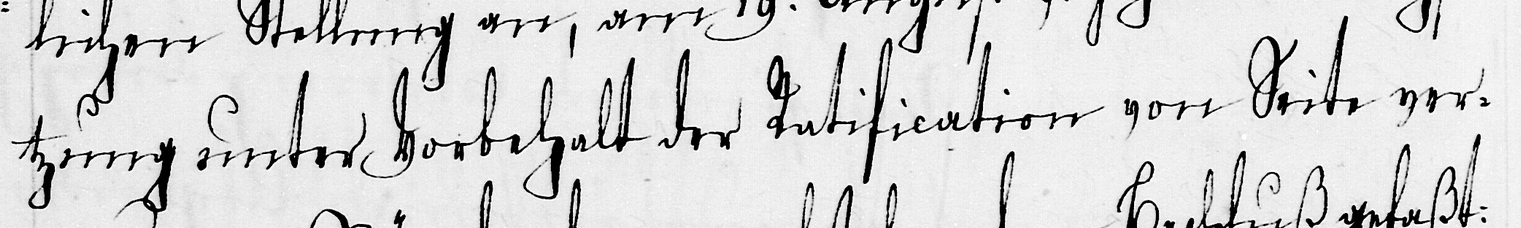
tzung unter Vorbehalt der Ratification von Seite vers¬
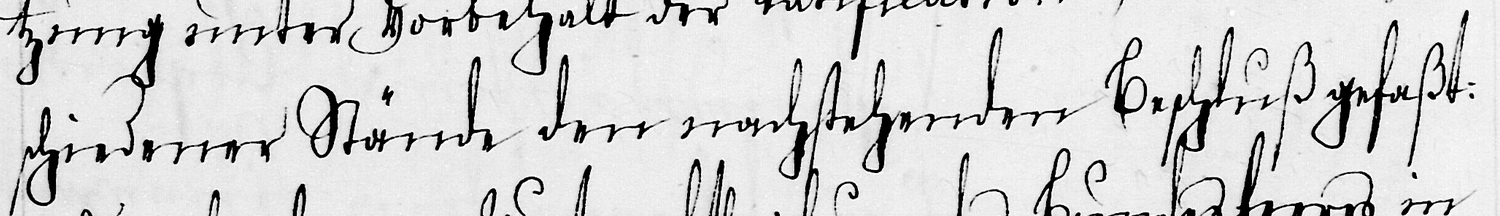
chiedener Stände den nachstehenden Beschluß gefaßt:
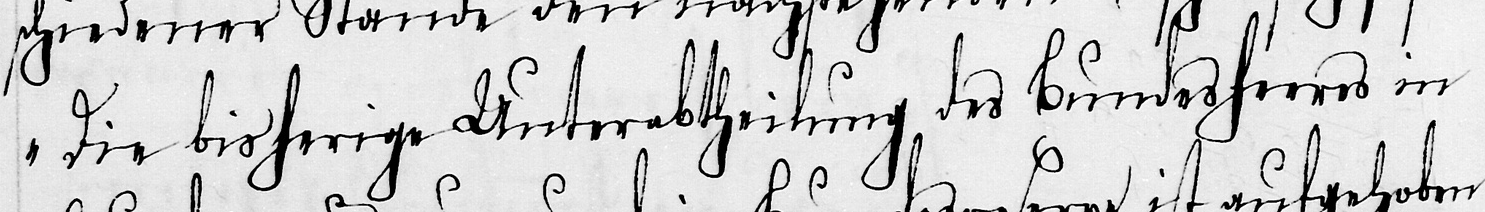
„Die bisherige Unterabtheilung des Bundesheeres in
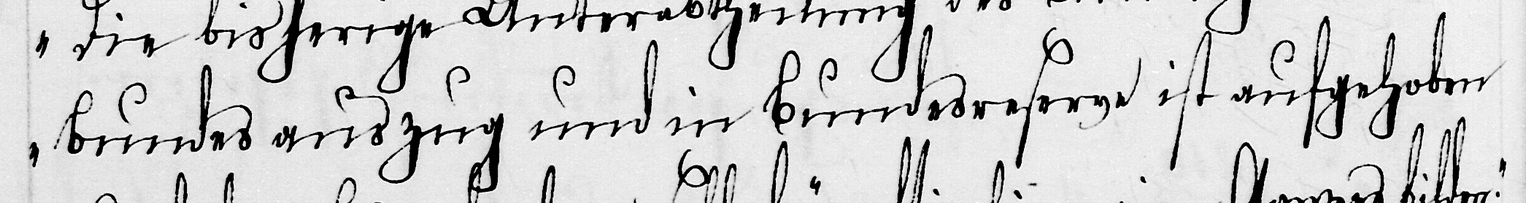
Bundesauszug und in Bundesreserve ist aufgehoben
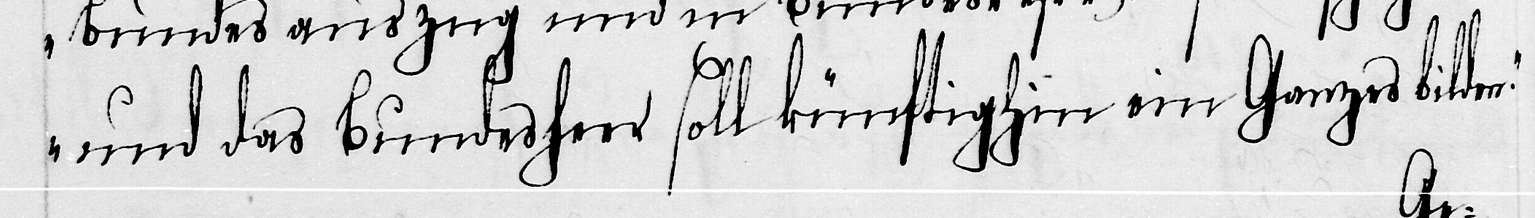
und das Bundesheer soll künftighin ein Ganzes bild¬
